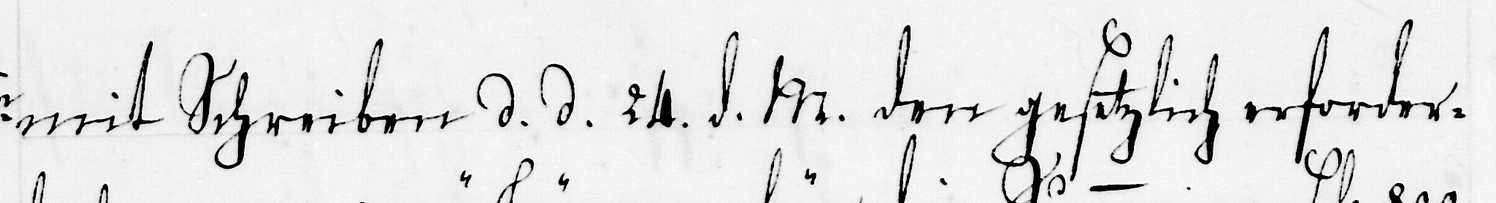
mit Schreiben d. d. 24. d. M. den gesetzlich erforder¬
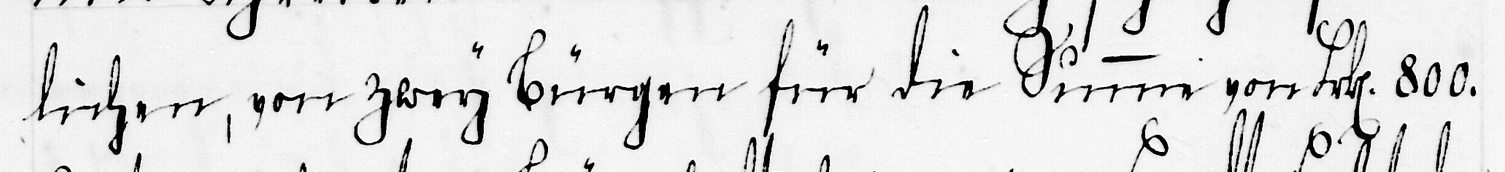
lichen, von zwey Bürgen für die Summe von Frk[en]. 800.
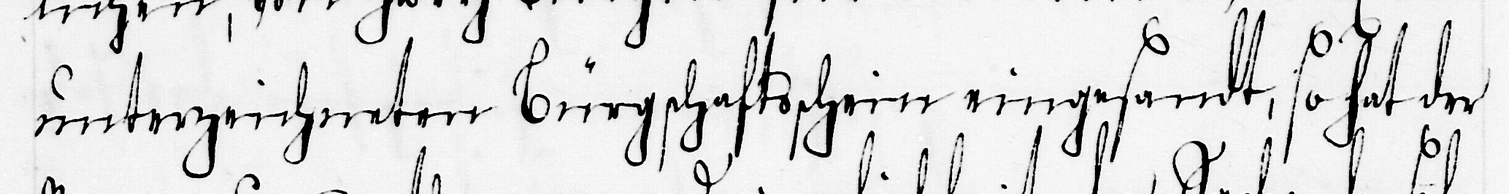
unterzeichneten Bürgschaftsschein eingesandt, so hat der
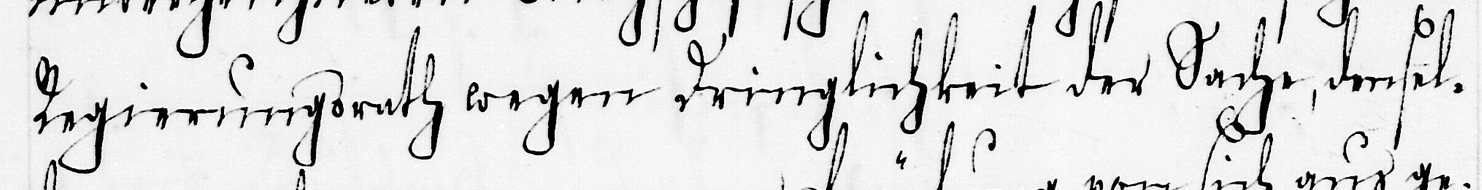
Regierungsrath wegen Dringlichkeit der Sache, densel¬
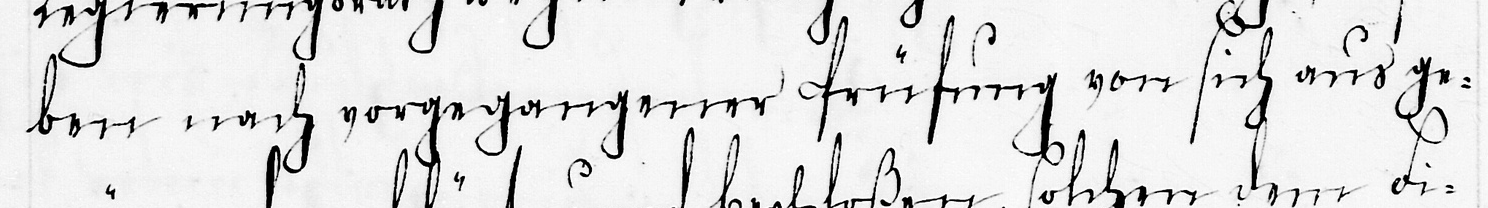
ben nach vorgegangener Prüfung von sich aus ge¬
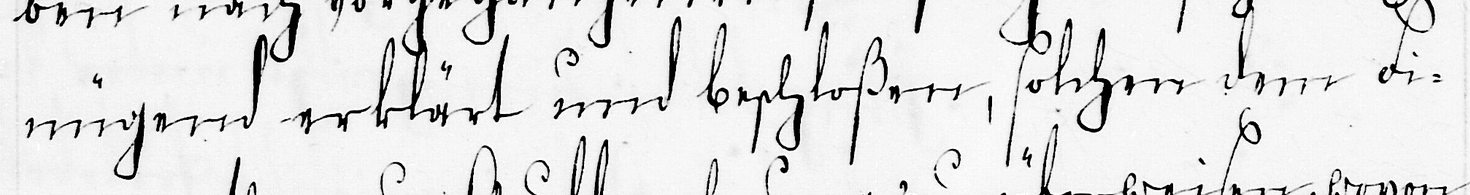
nügend erklärt und beschloßen, solchen dem Fi¬
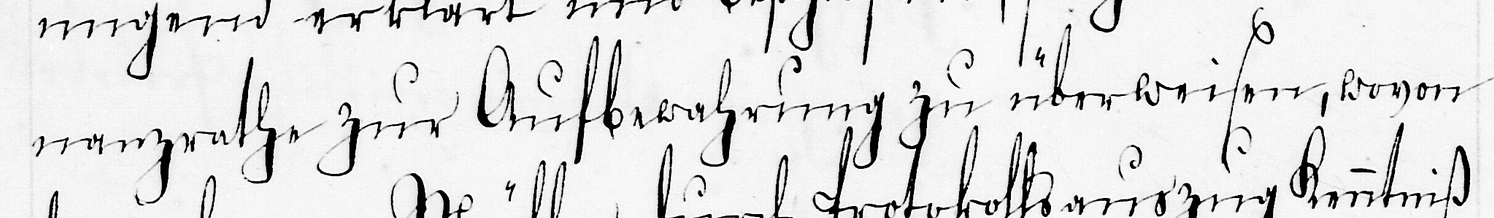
nanzrathe zur Aufbewahrung zu überweisen, wovon
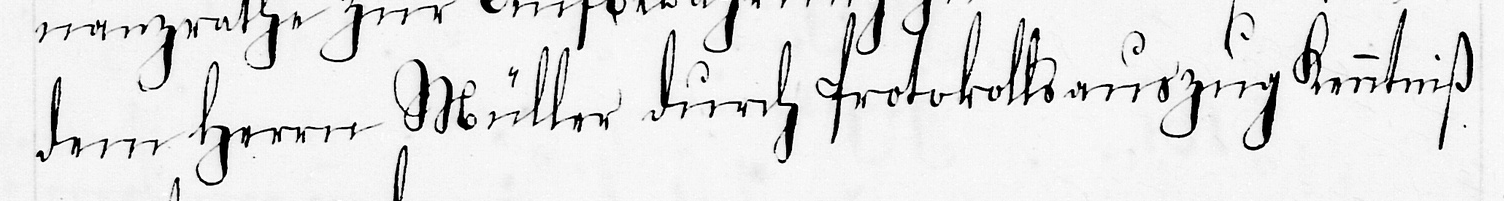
dem Herrn Müller durch Protokollsauszug Kenntniß
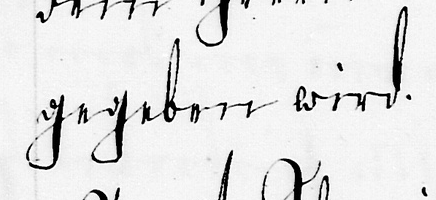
gegeben wird.
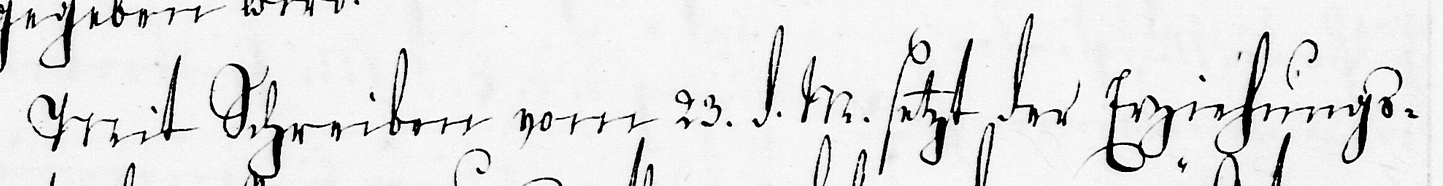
Mit Schreiben vom 23. d. M. setzt der Erziehungs¬
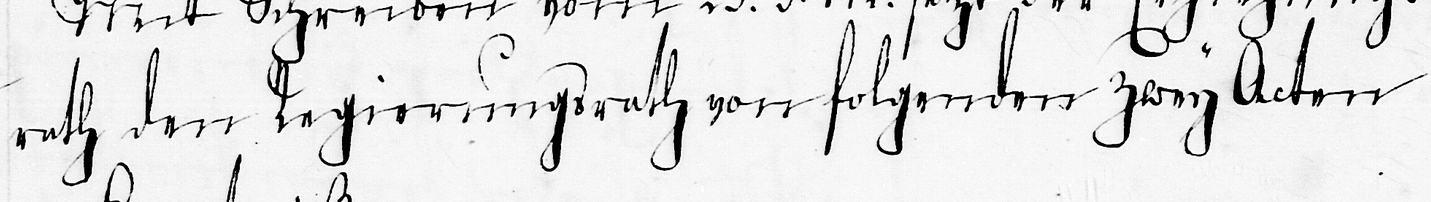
rat den Regierungsrath von folgenden zwey Acten
